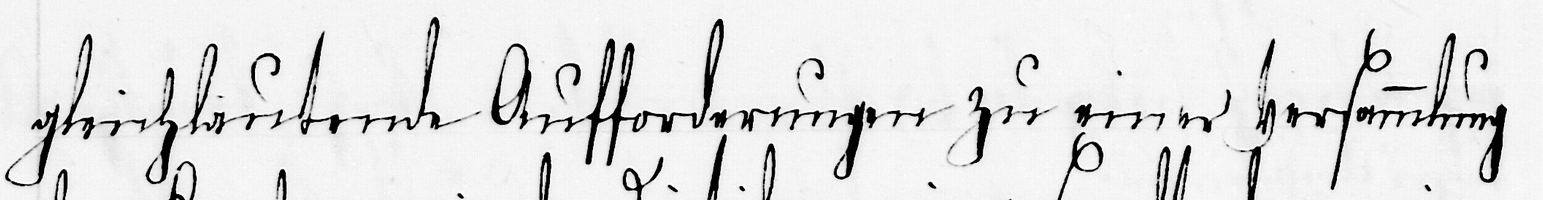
gleichlautende Aufforderungen zu einer Versammlu¬
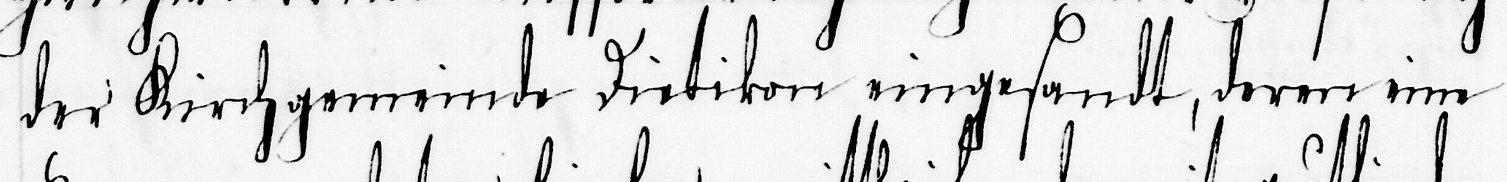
der Kirchgemeinde Dietikon eingesandt, deren eine
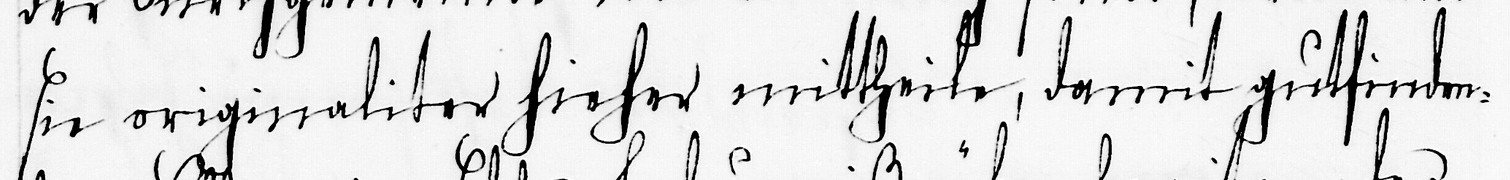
sie originaliter hieher mittheilte, damit gutfinden¬
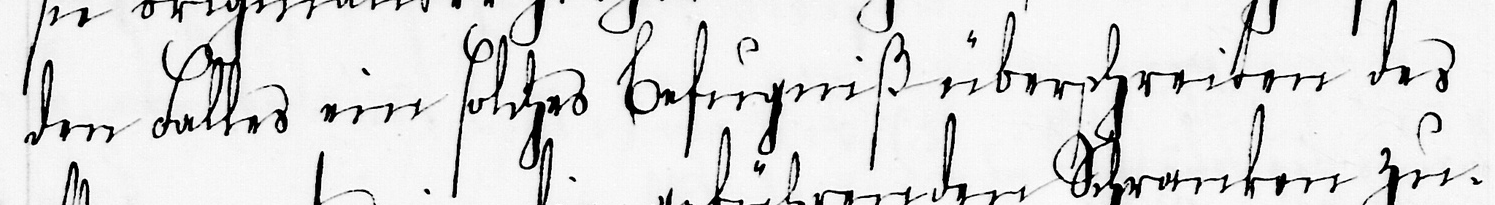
den Falles ein solches Befugnißüberschreiten des
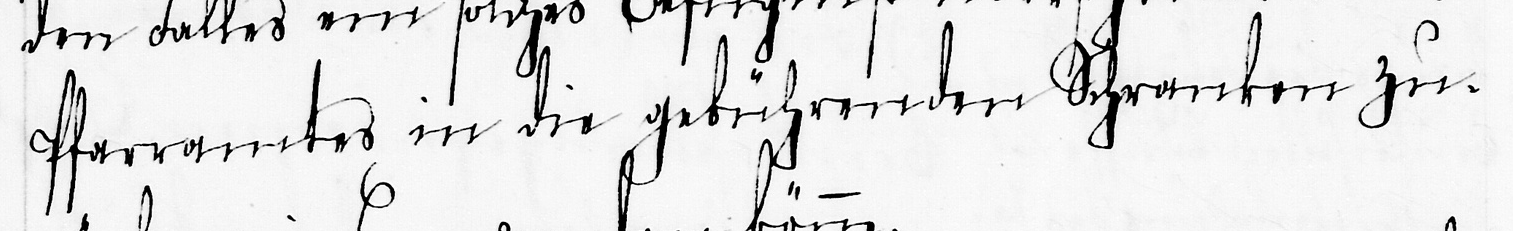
Pfarramtes in die gebührenden Schranken zu¬
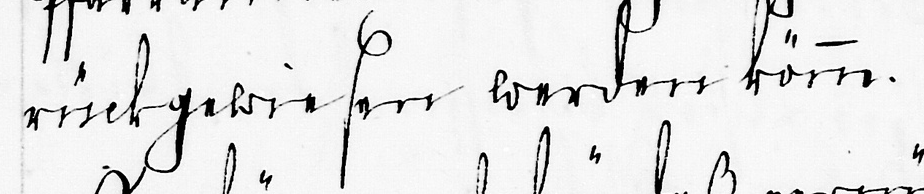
rückgewiesen werden könne.
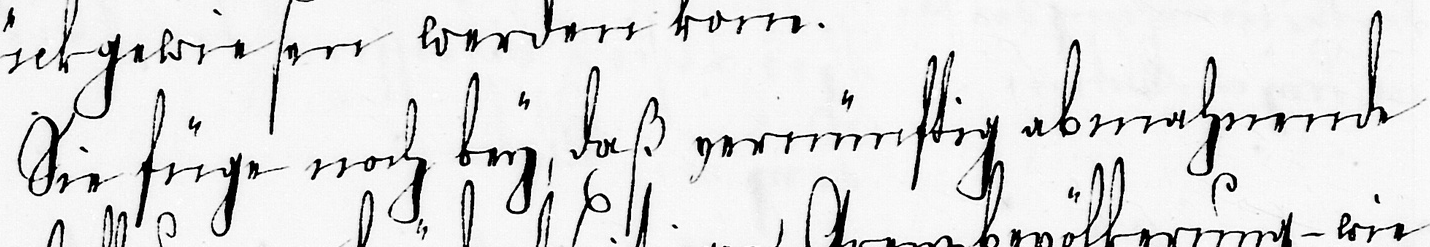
Sie füge noch bey, daß vernünftig abmahnende
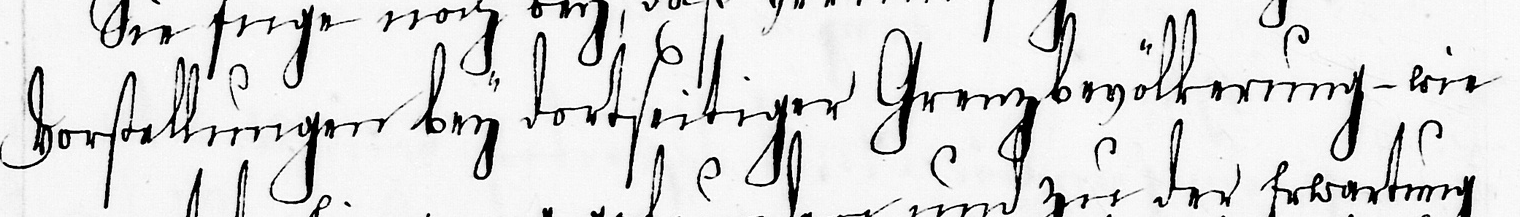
Vorstellungen bey dortseitiger Grenzbevölkerung – wie
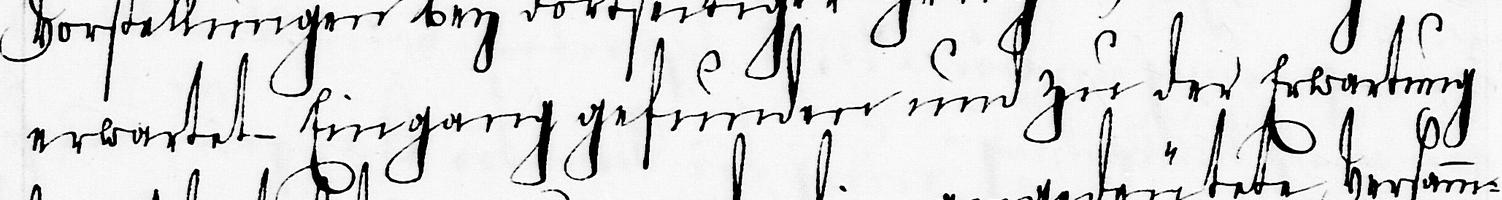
erwartet – Eingang gefunden und zu der Erwartung
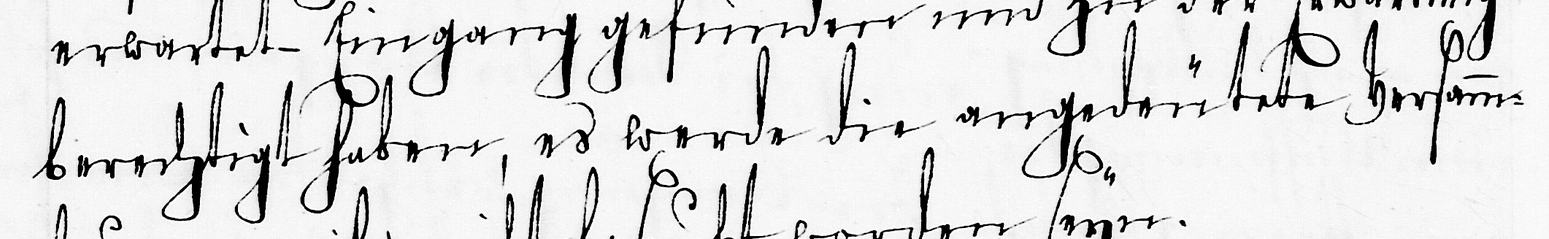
berechtigt haben, es werde die angedeutete Versam¬
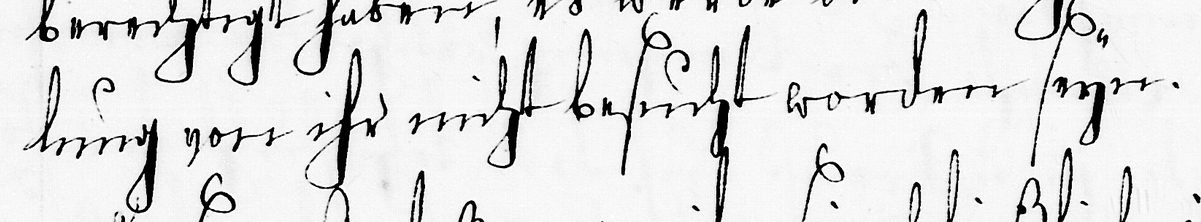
mlung von ihr nicht besucht worden seyn.
